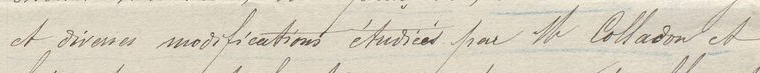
et diverses modifications étudiées par Mr Colladon et
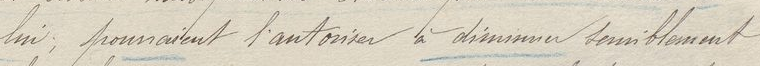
lui, pourraient l'autoriser à diminuer sensiblement
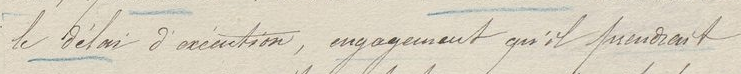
le délai d'exécution, engagement qu'il prendrait
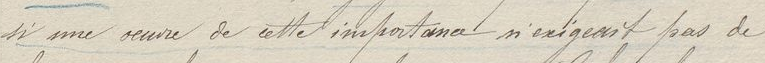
si une oeuvre de cette importance n'exigeait pas de
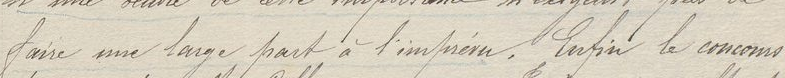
faire une large part à l'imprévu. Enfin le concours
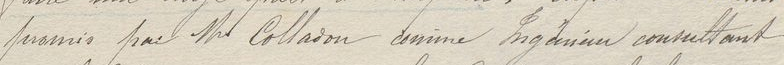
promis par Mr Colladon comme Ingénieur consultant
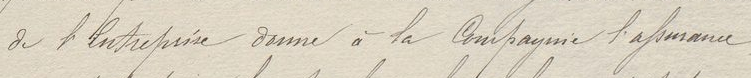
de l'Entreprise donne à la Compagnie l'assurance,
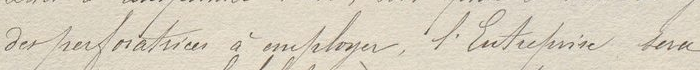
des perforatrices à employer, l'Entreprise sera
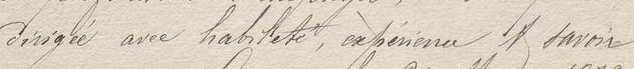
dirigée avec habileté, expérience & savoir.
